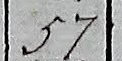57
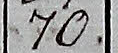70
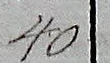40
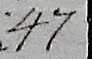47
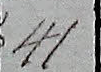41
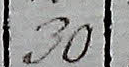30
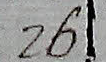26
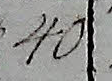40
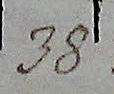38
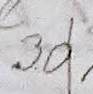30
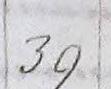39
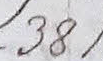38
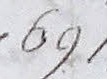69
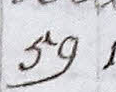59
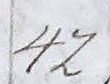42
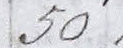50
